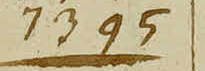7395
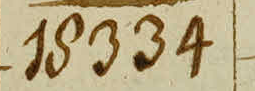18334
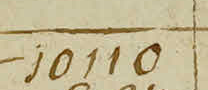10110
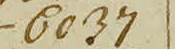6037
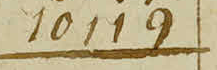10119
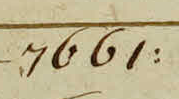7661
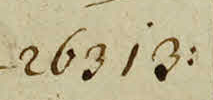26313
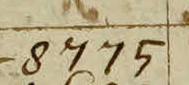8775
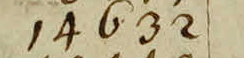14632
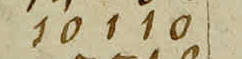10110
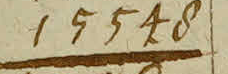15548
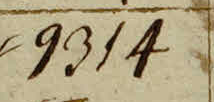9314
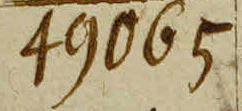49065
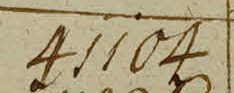41104
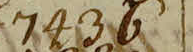7436
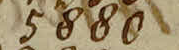5880
